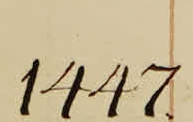1447
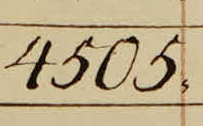4505
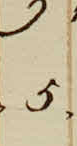5
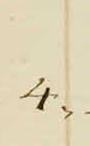4
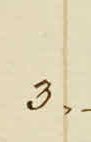3
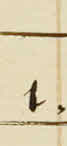1
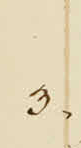3
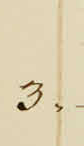3
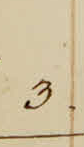3
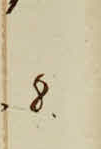8.
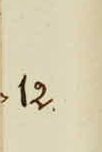12.
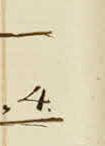4.
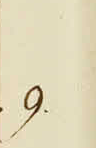9.
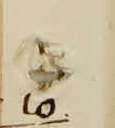10.
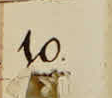10.
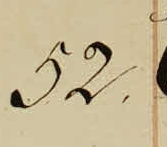52.
